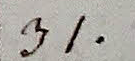31.
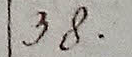38.
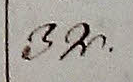32
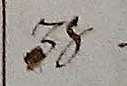38
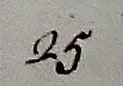25
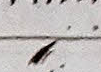1.
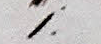1.
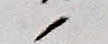1
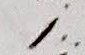1
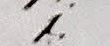1.
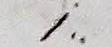1.
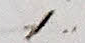1
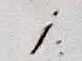1
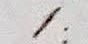1
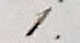1
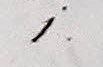1.
